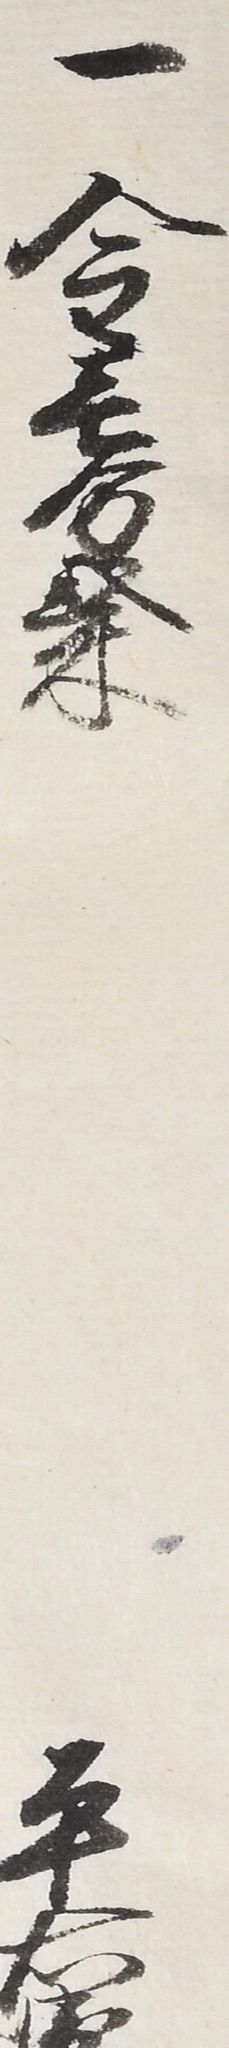一金壱分弐朱平右衛門
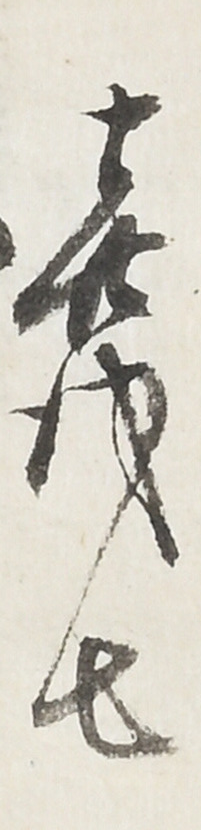喜代七
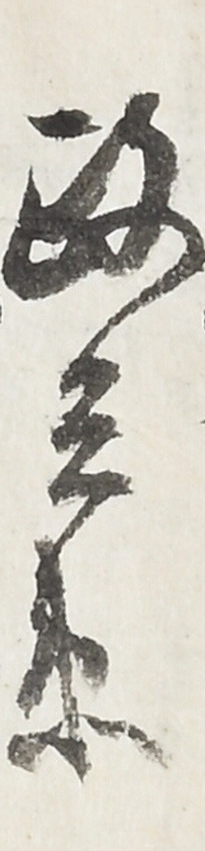荘兵衛
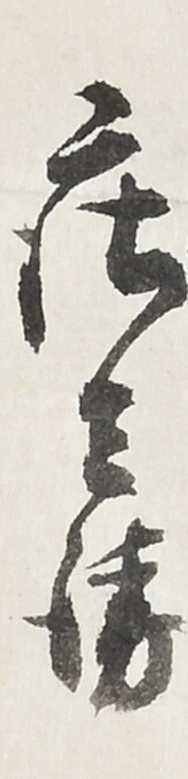荘兵衛

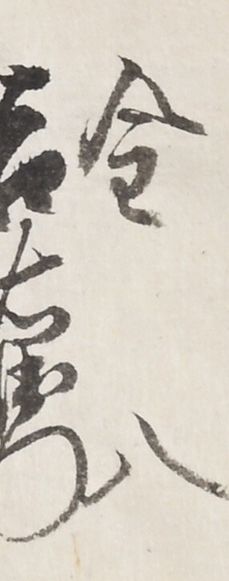吉右衛門
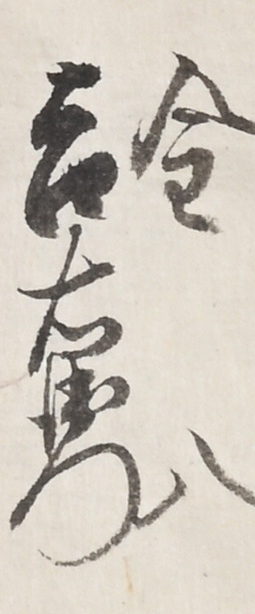吉右衛門
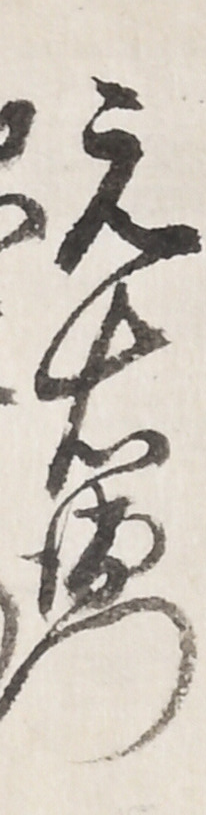元右衛門
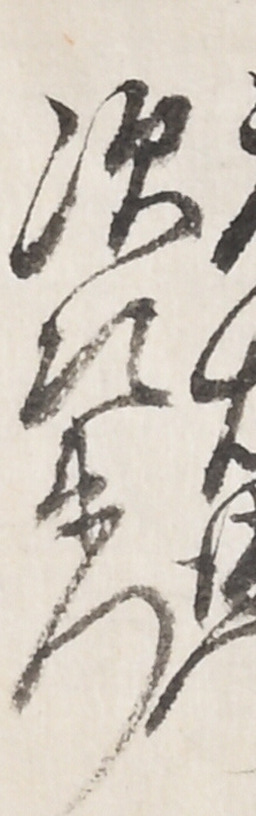吉右衛門
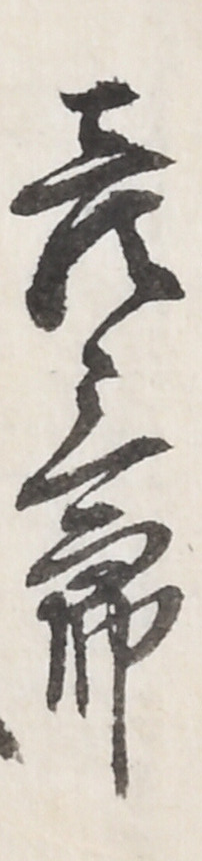彦三郎
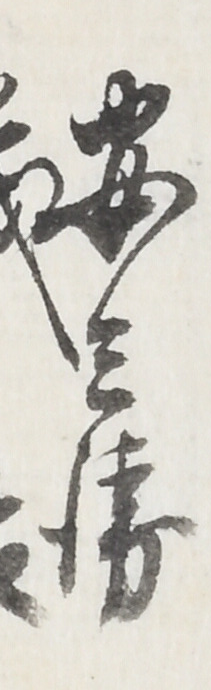安兵衛
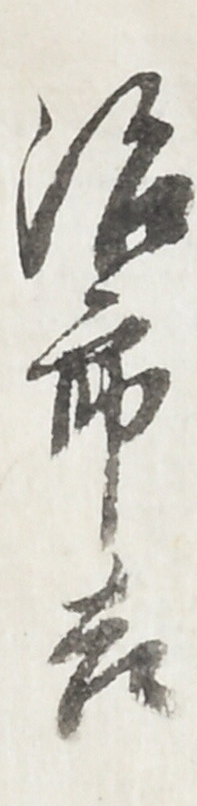治郎吉
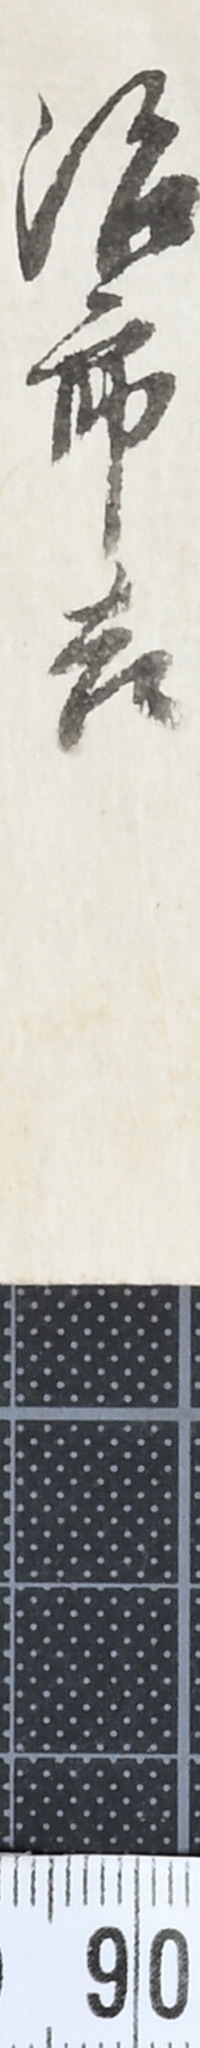治郎吉

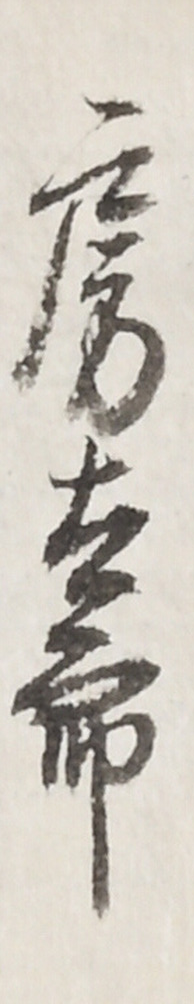房太郎
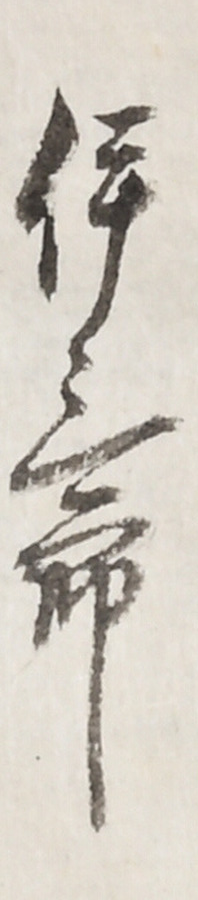儀三郎
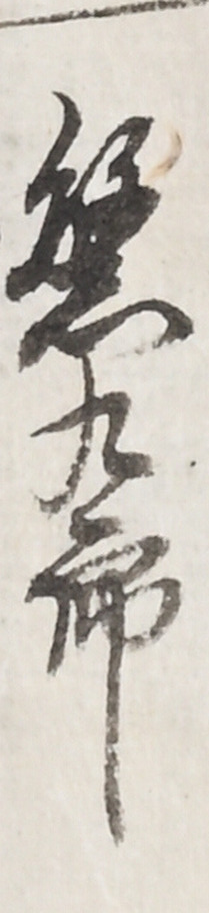繁九郎
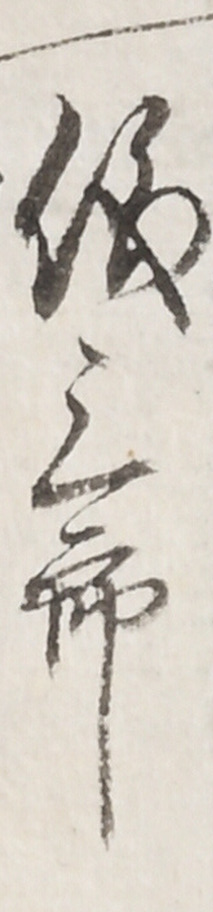儀三郎
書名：御拝地百五拾年御祝儀献上御目録名前
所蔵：伊那市立高遠町図書館・合同会社AMANE
